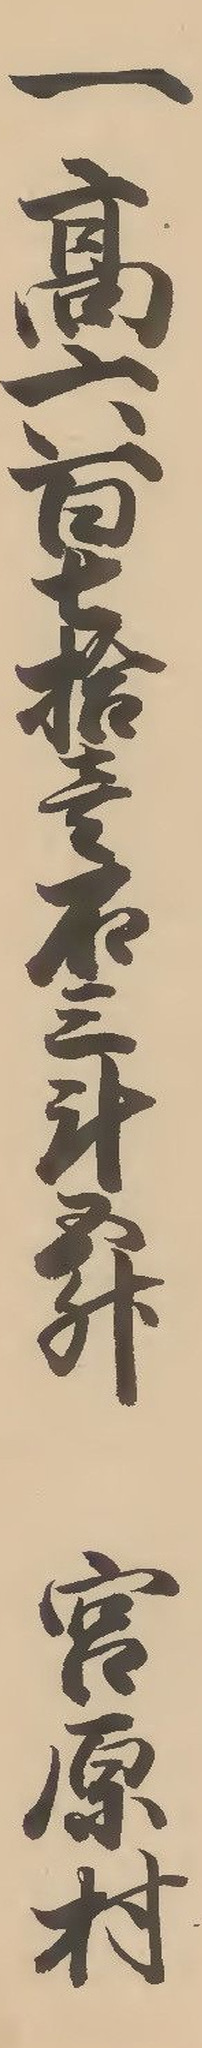一髙六百七拾壱石三斗五升宮原村

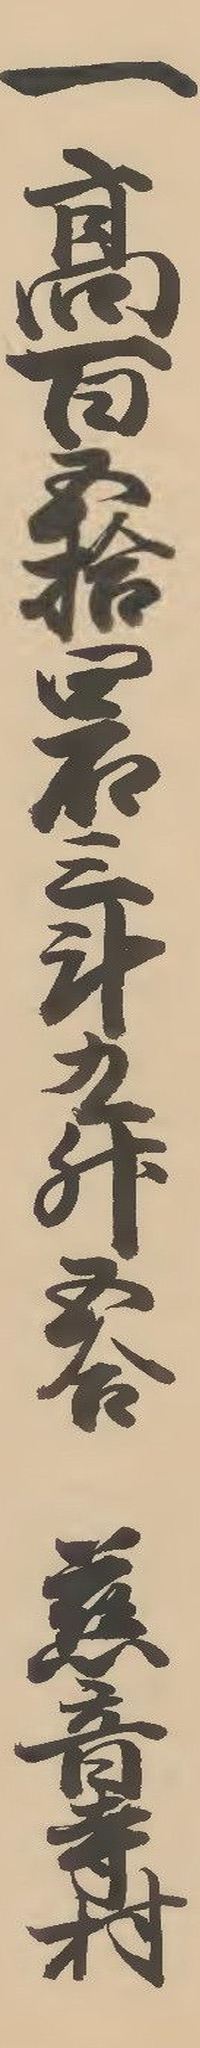一髙百五拾四石三斗九升五合慈音寺村
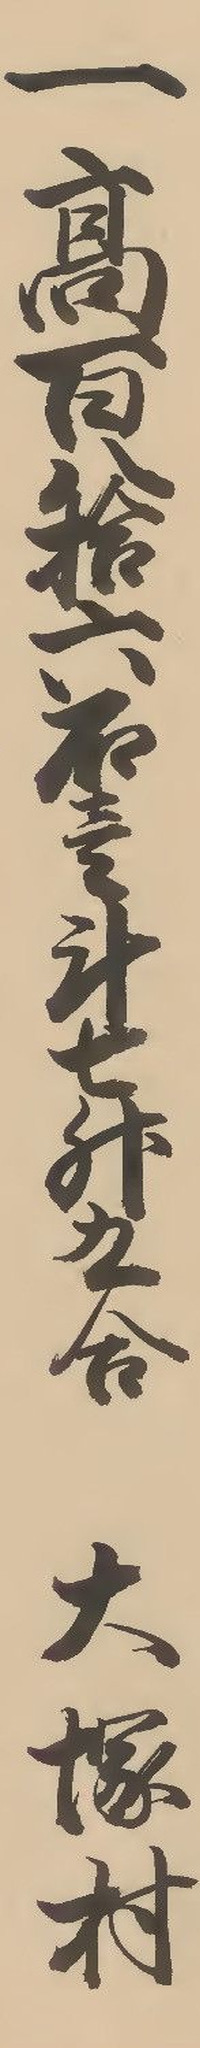一髙百八拾六石壱斗七升九合大塚村
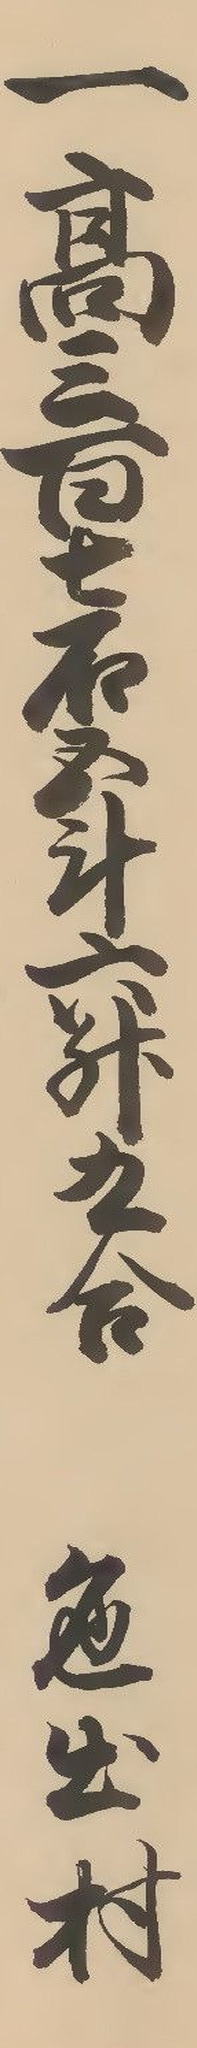一髙三百七石五斗六升九合色出村
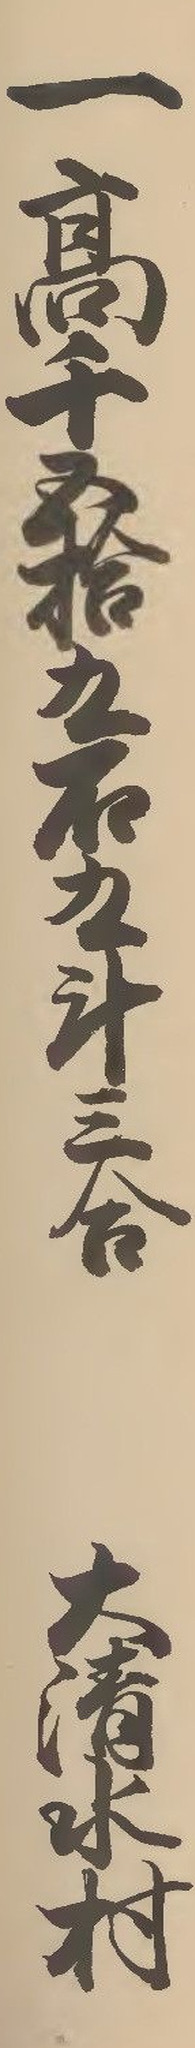一髙千五拾九石九斗三合大清水村
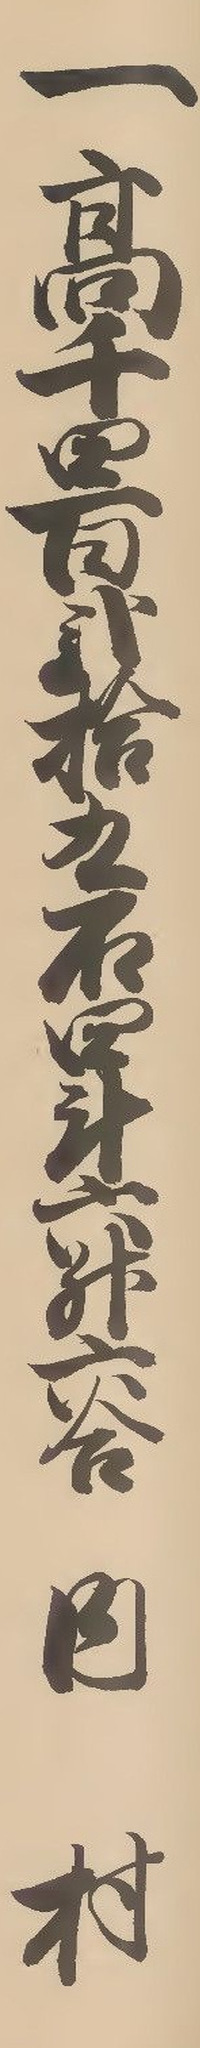一髙千四百弐拾九石四斗六升六合内村
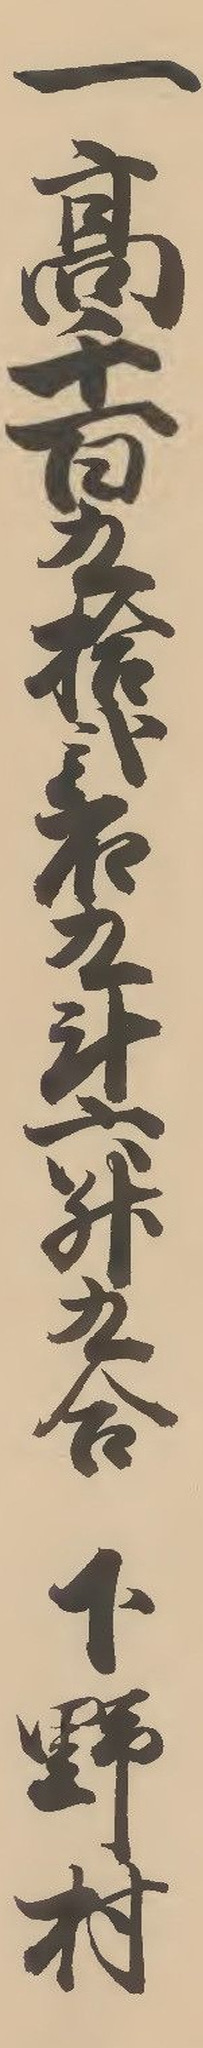一髙千百九拾弐石九斗六升九合下野村
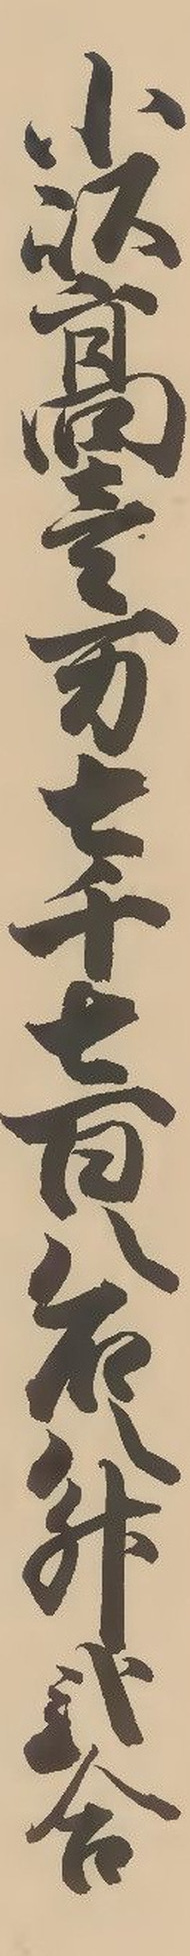小以髙壱万七千七百八石八升弐合

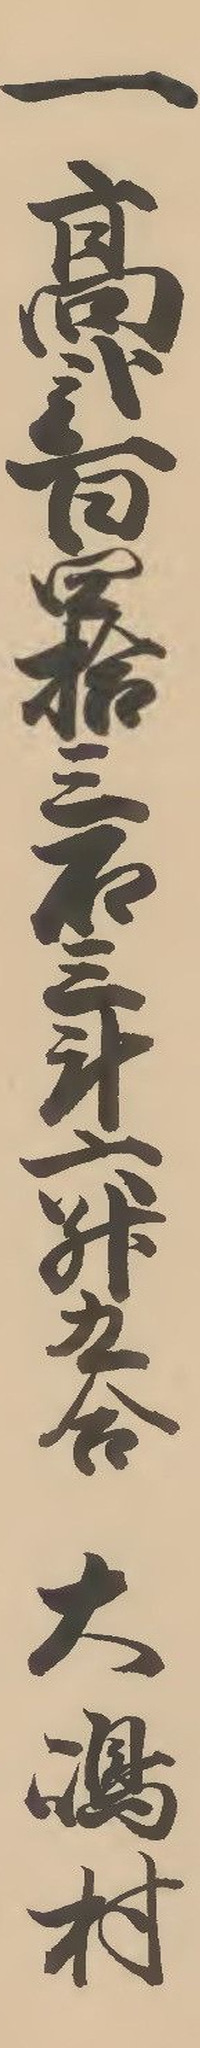一髙弐百四拾三石三斗六升九合大嶋村
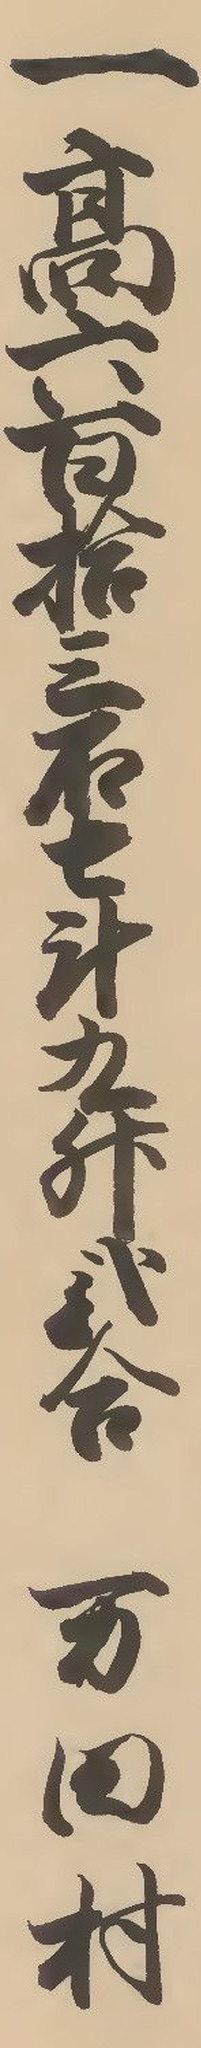一髙六百拾三石七斗九升弐合万田村
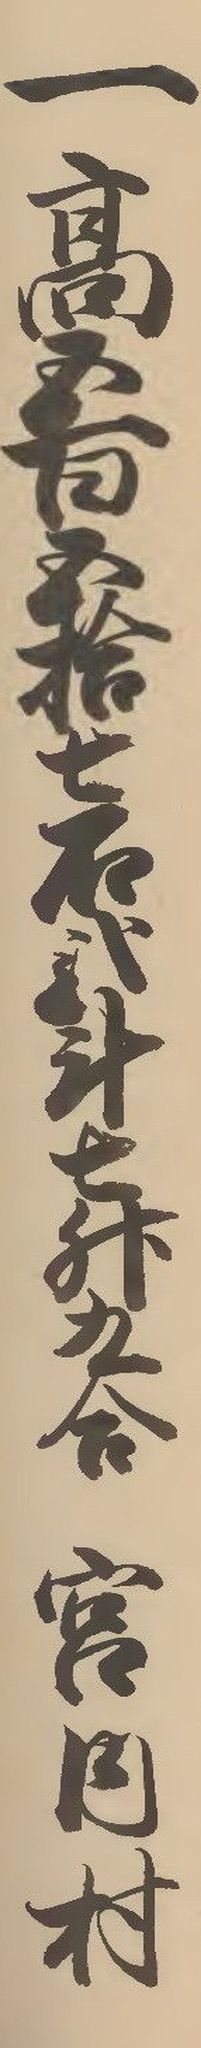一髙五百五拾七石弐斗七升九合宮内村
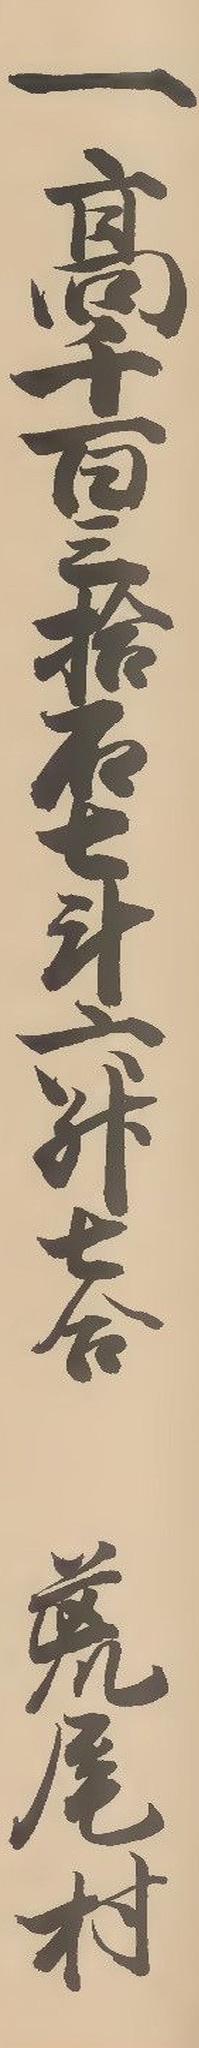一髙千百三拾石七斗六升七合荒尾村
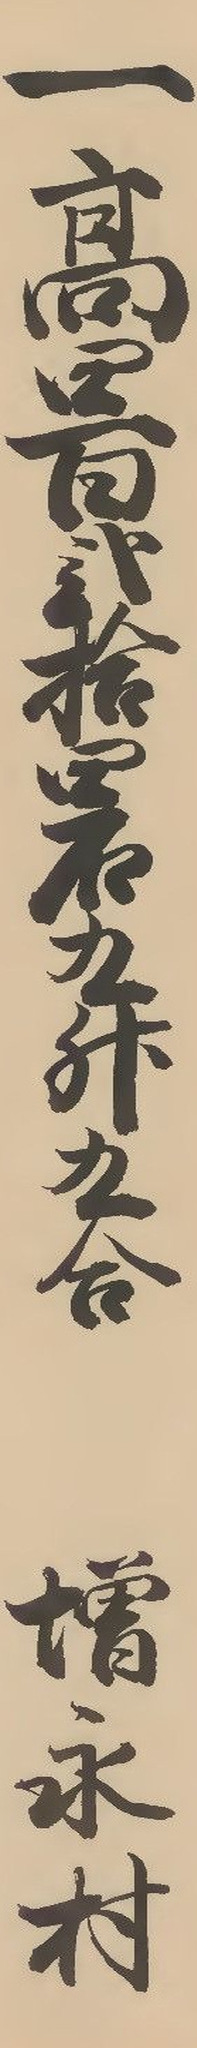一髙四百弐拾四石九升九合増永村
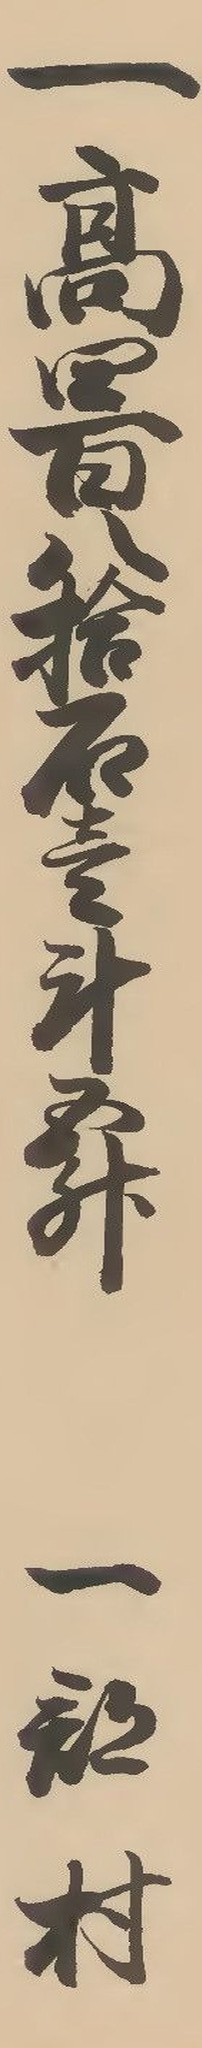一髙四百八拾石壱斗五升一部村
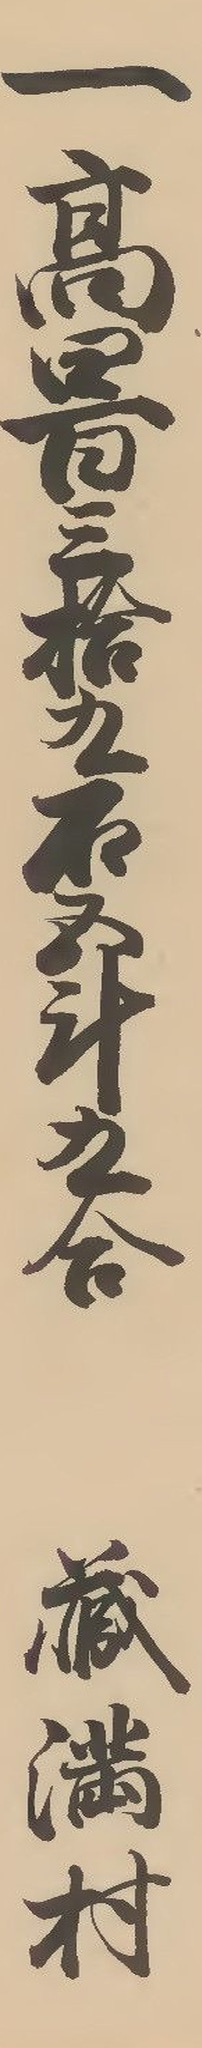一髙四百三拾九石五斗九合藏満村

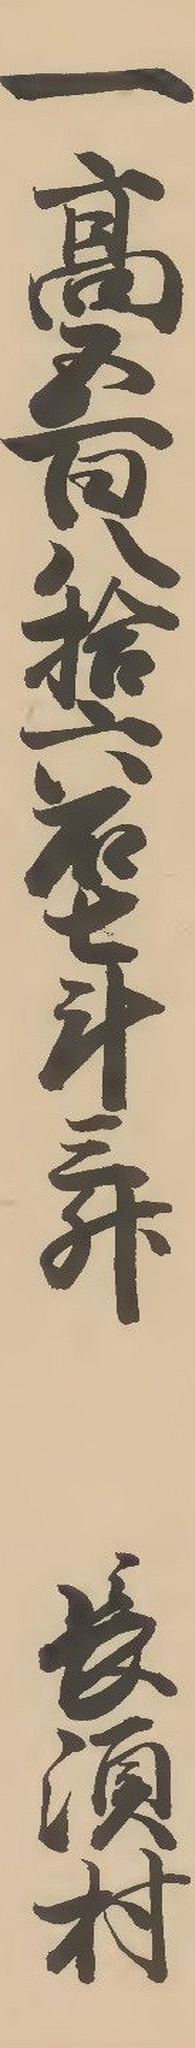一髙五百八拾六石七斗三升長須村
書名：肥後国郷帳
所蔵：国立公文書館 National Archives of Japan
